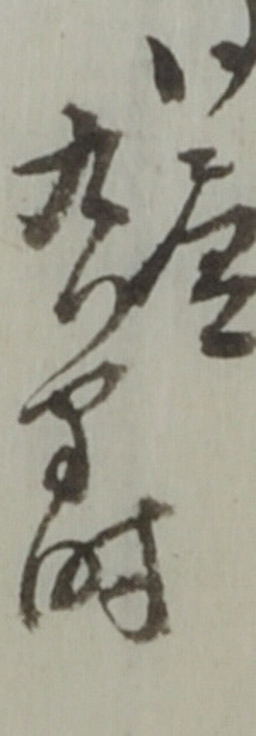四ツ半時
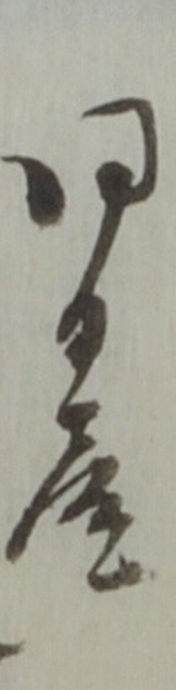同日昼
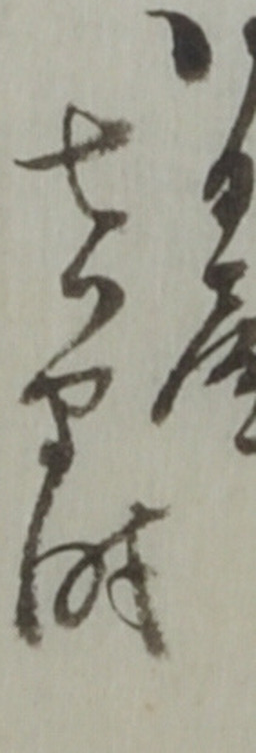四ツ半時
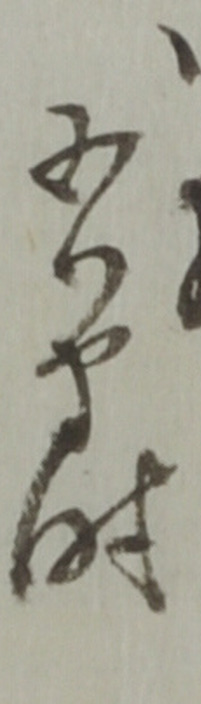四ツ半時
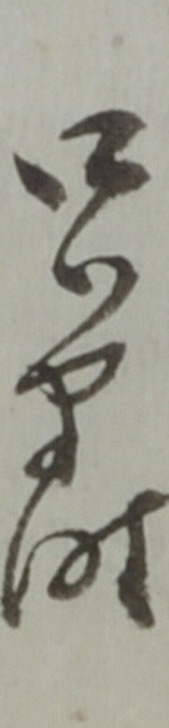四ツ半時
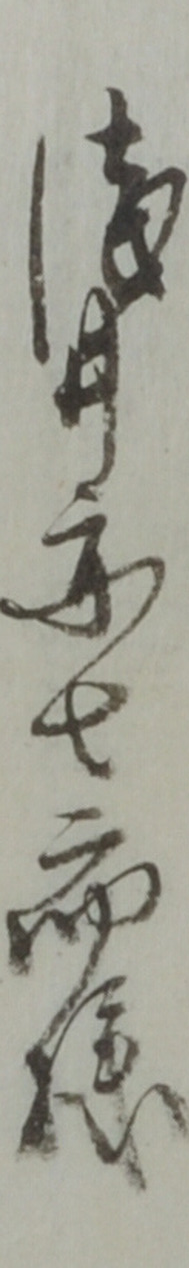浅井亦七郎様
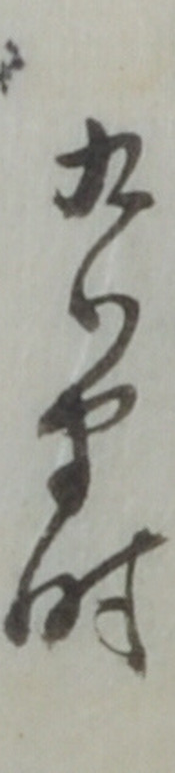四ツ半時
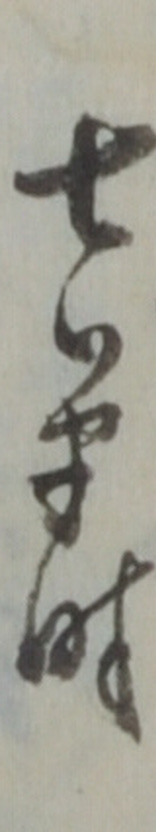四ツ半時
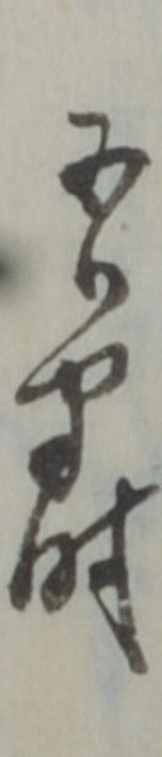四ツ半時
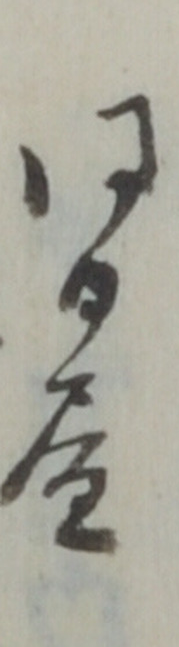同日昼
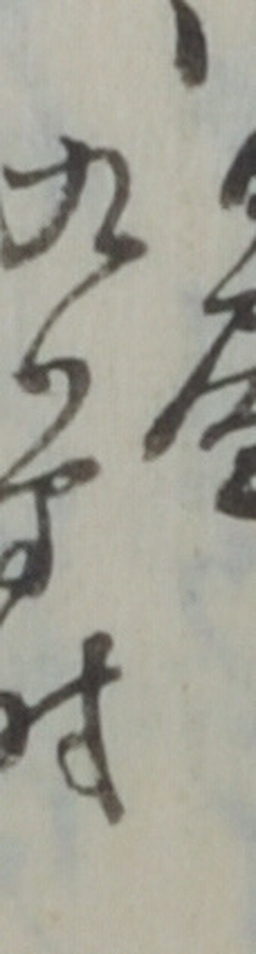四ツ半時

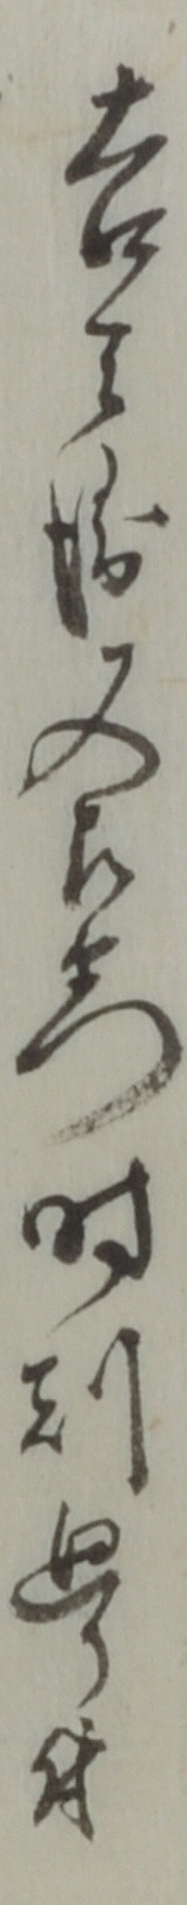吉兵衛又左衛門時刻廻リニ付
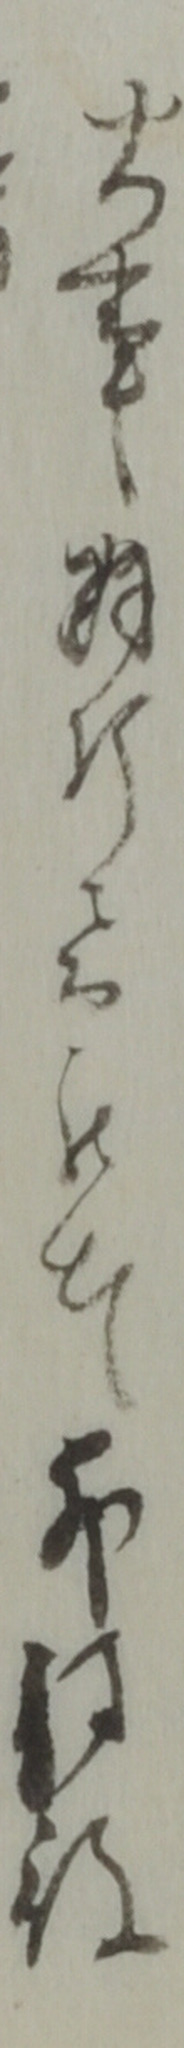火事村打ニ而罷出候外村役
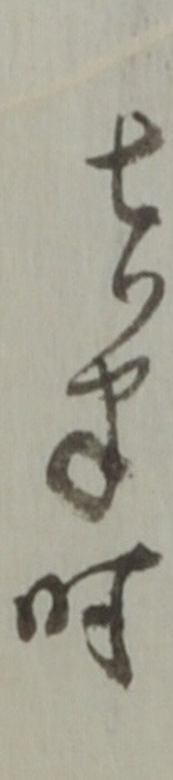七ツ半時
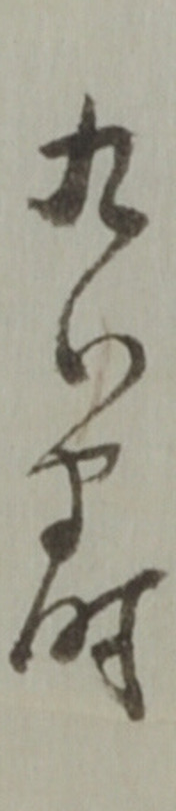九ツ半時
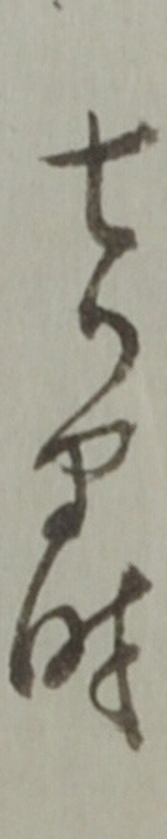七ツ半時
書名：日光御参詣ニ付町方警固番割名前控
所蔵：伊那市立高遠町図書館・合同会社AMANE
